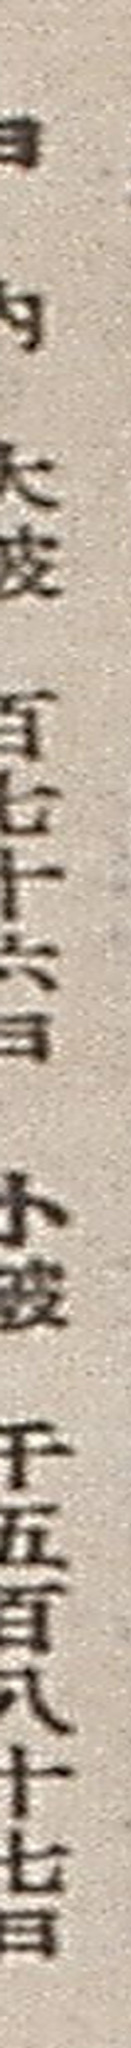戸内大破百七十六戸小破千五百八十七戸
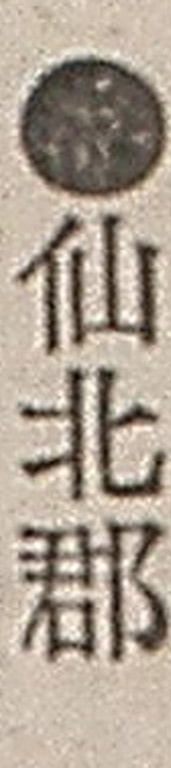●仙北郡
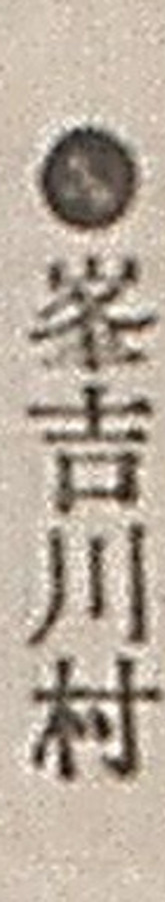●峯吉川村
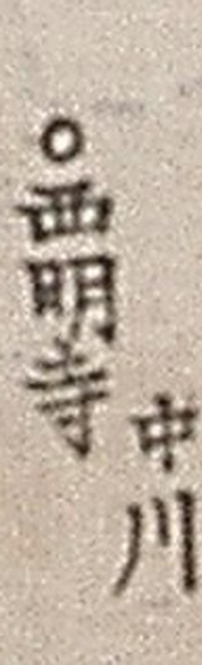〇西明寺
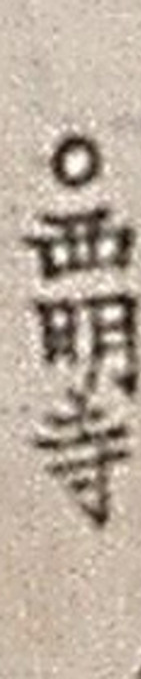〇西明寺
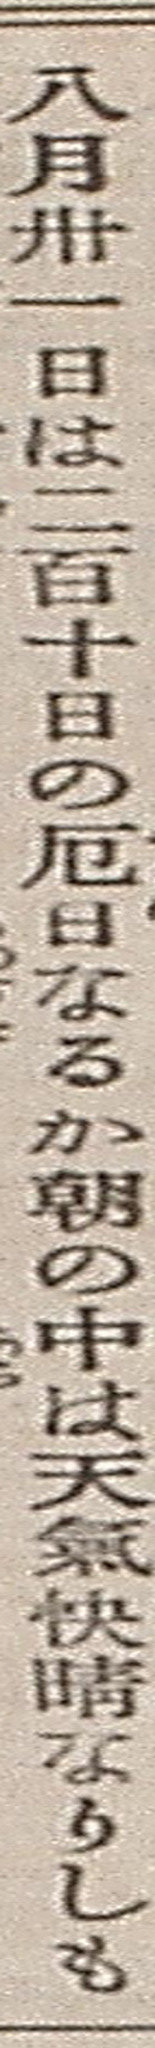八月卅一日は二百十日の厄日なるか朝の中は天気快晴なりしも
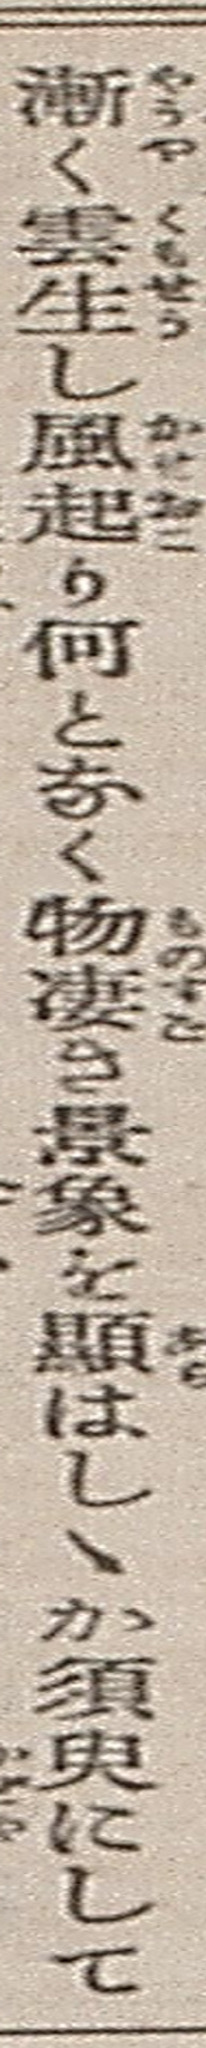漸く雲生し風起り何となく物凄き景象を顕はしゝか須臾にして
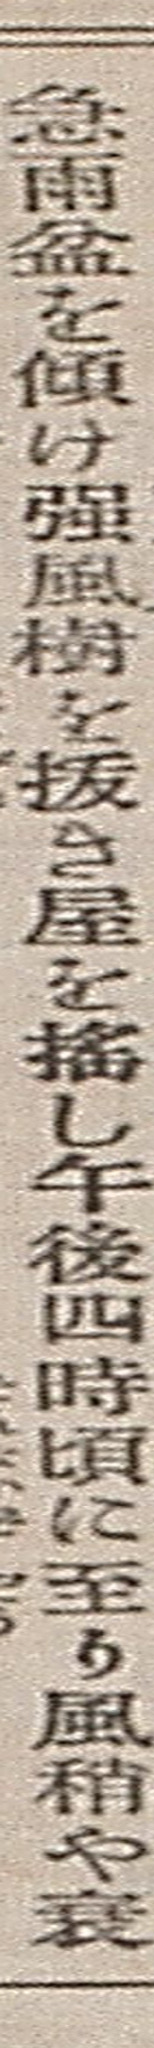急雨盆を傾け強風樹を抜き屋を揺し午後四時頃に至り風稍や衰
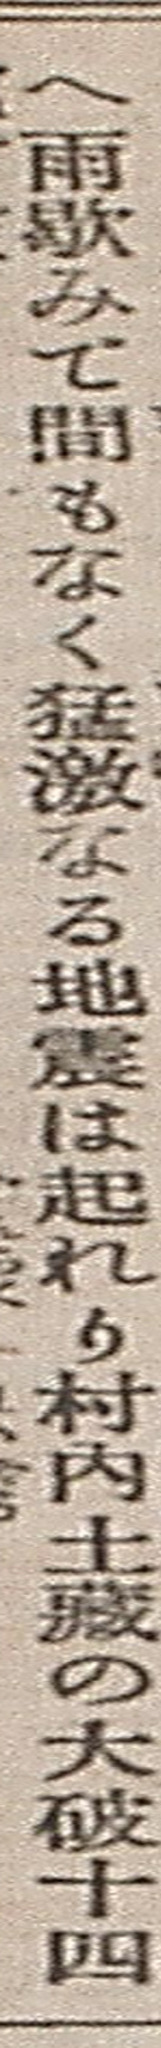へ雨歇みて間もなく猛激なる地震は起れり村内土蔵の大破十四
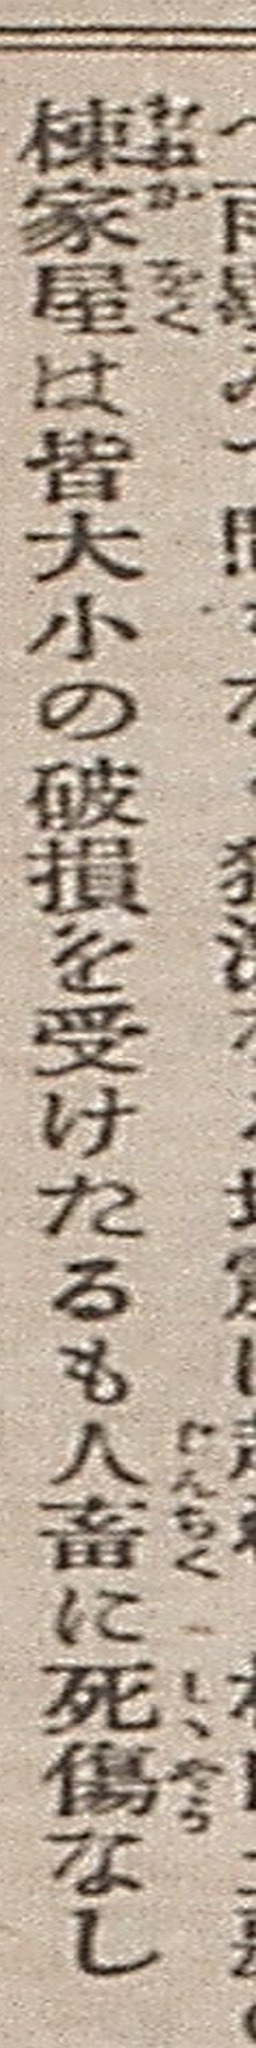棟家屋は皆大小の破損を受けたるも人畜に死傷なし

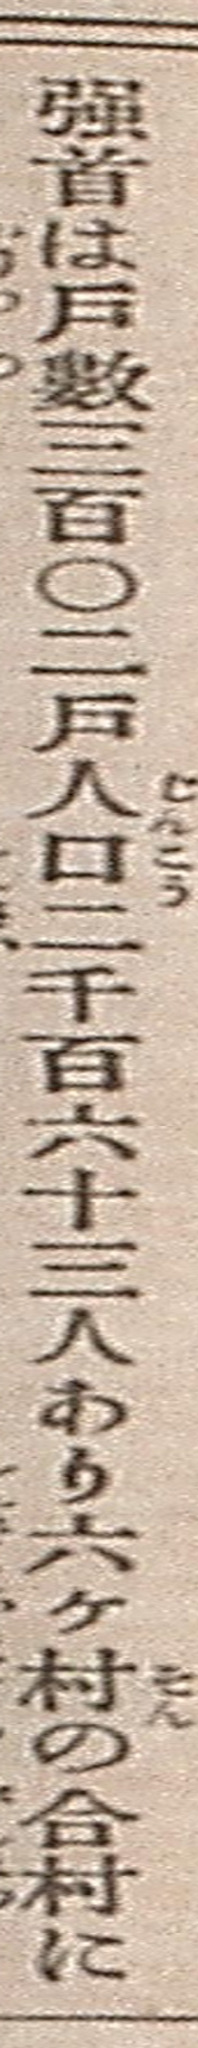強首は戸数三百〇二戸人口二千百六十三人あり六ケ村の合村に
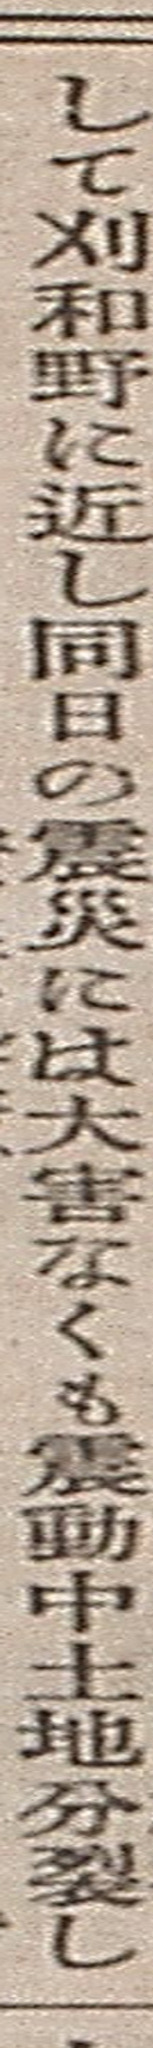して刈和野に近し同日の震災には大害なくも震動中土地分裂し
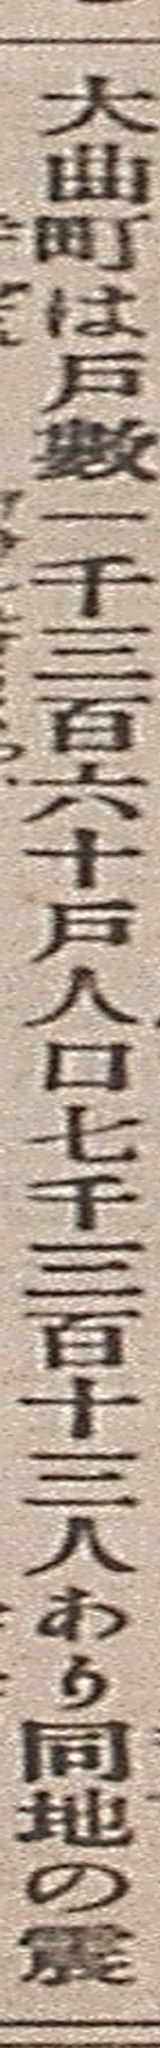大曲町は戸数一千三百六十戸人口七千三百十三人あり同地の震
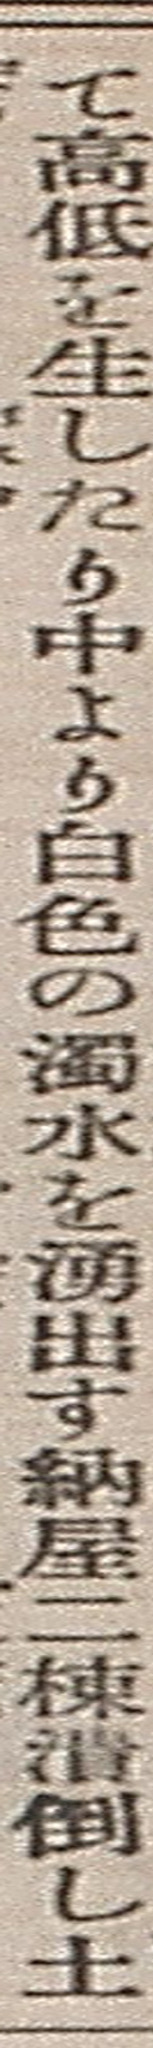て高低を生したり中より白色の濁水を湧出す納屋ニ棟潰倒し土
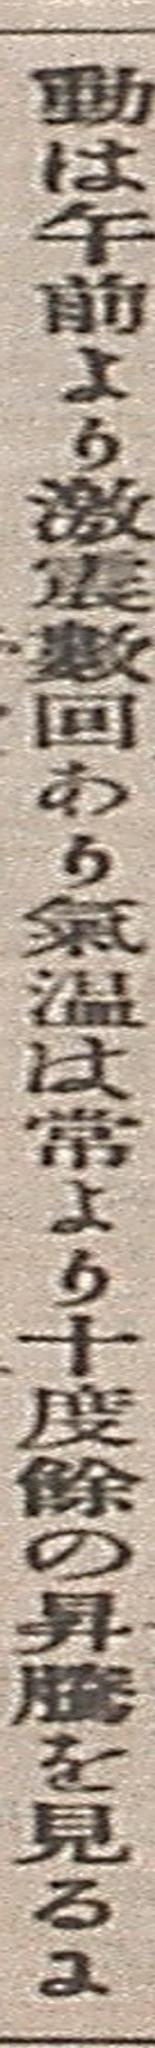動は午前より激震数回あり気温は常より十度余の昇騰を見るに
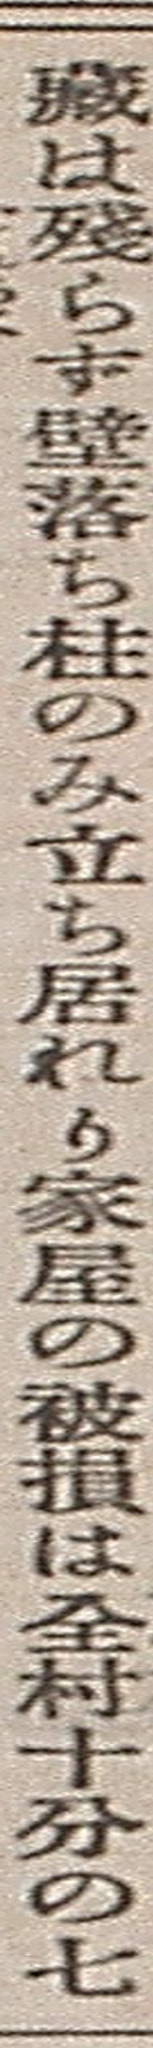藏は残らず壁落ち柱のみ立ち居れり家屋の被損は全村十分の七
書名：風俗畫報臨時増刊第百二十四號　洪水地震被害録（上）
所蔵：東京大学地震研究所図書室 Earthquake Research Institute Library, The University of Tokyo, JAPAN
